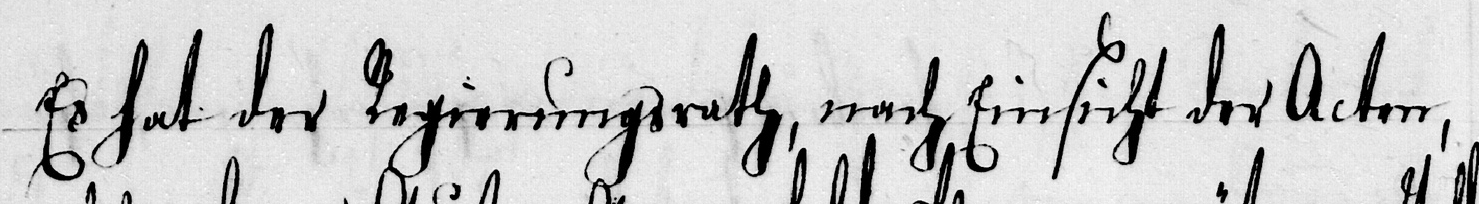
Es hat der Regierungsrath, nach Einsicht der Acten,
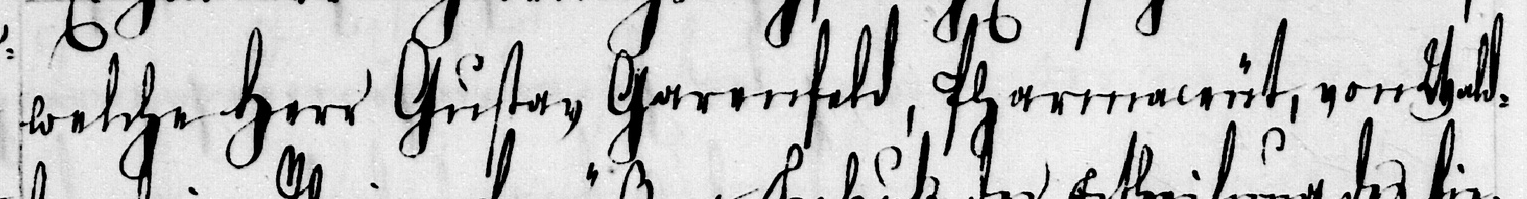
welche Herr Gustav Garenfeld, Pharmaceut, von Wal¬
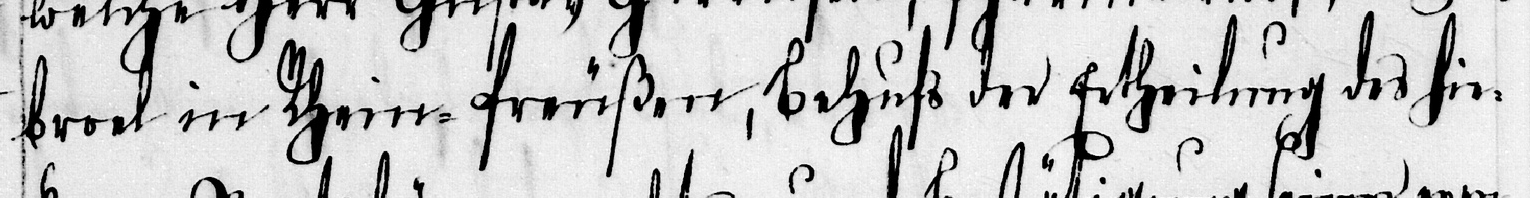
dbroel in Rhein-Preußen, Behufs der Ertheilung des hie¬
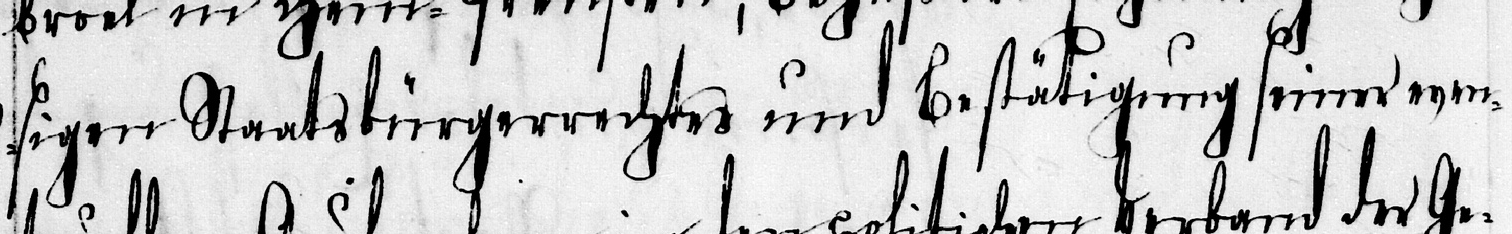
sigen Staatsbürgerrechtes und Bestätigung seiner even¬
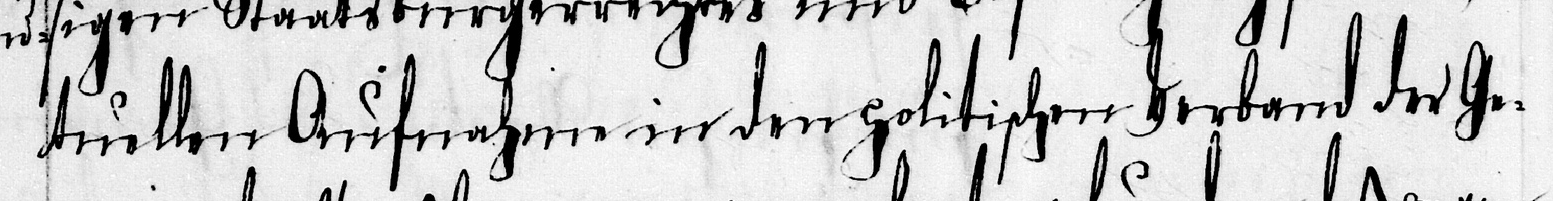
tuellen Aufnahme in den politischen Verband der Ge¬
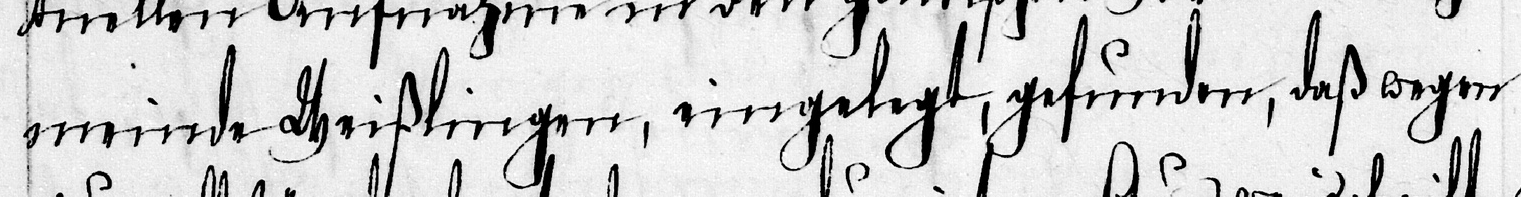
meinde Weißlingen, eingelegt, gefunden, daß wegen
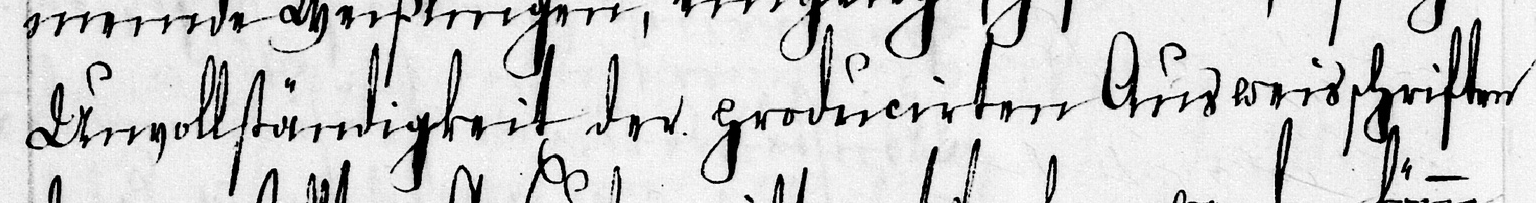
Unvollständigkeit der producirten Ausweisschriften
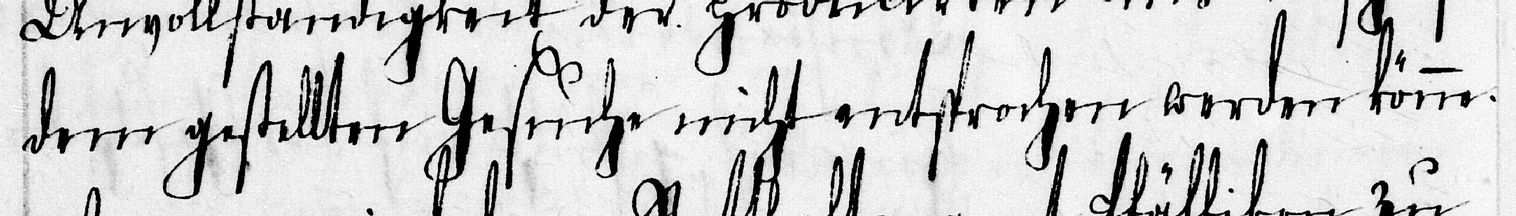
dem gestellten Gesuche nicht entsprochen werden könn¬
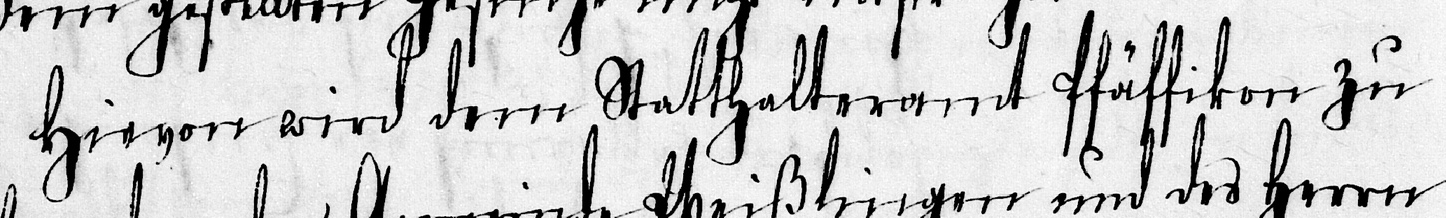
Hievon wird dem Statthalteramt Pfäffikon zu
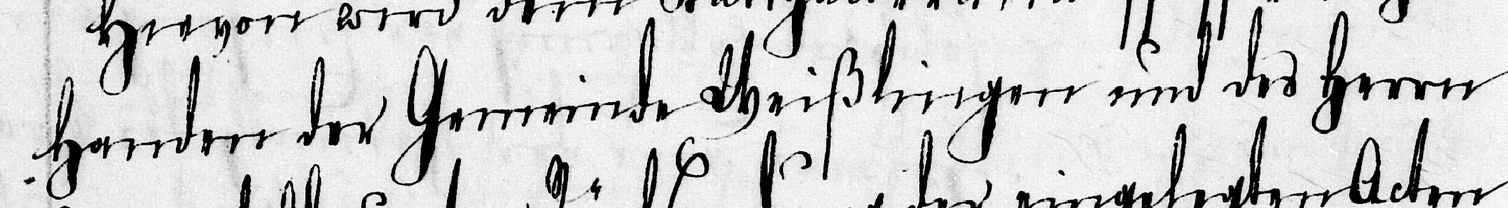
Handen der Gemeinde Weißlingen und des Herrn
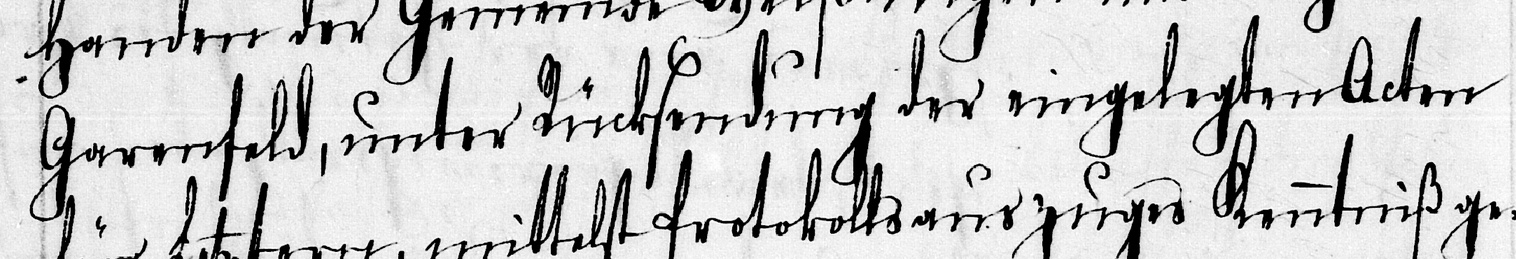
Garenfeld, unter Rücksendung der eingelegten Acten
